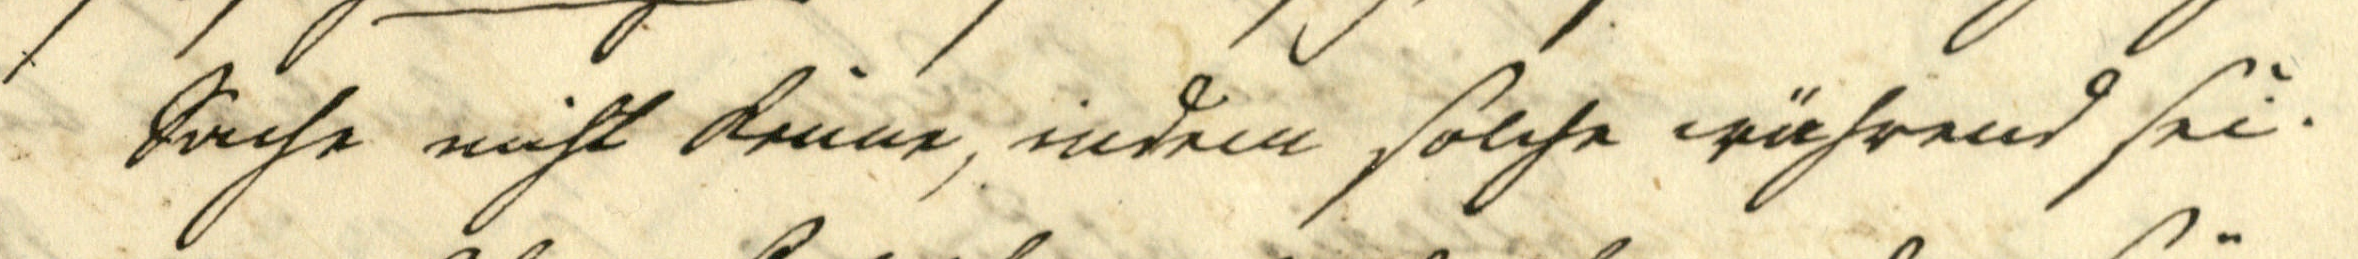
Sache nicht kenne, indem solche während sei¬
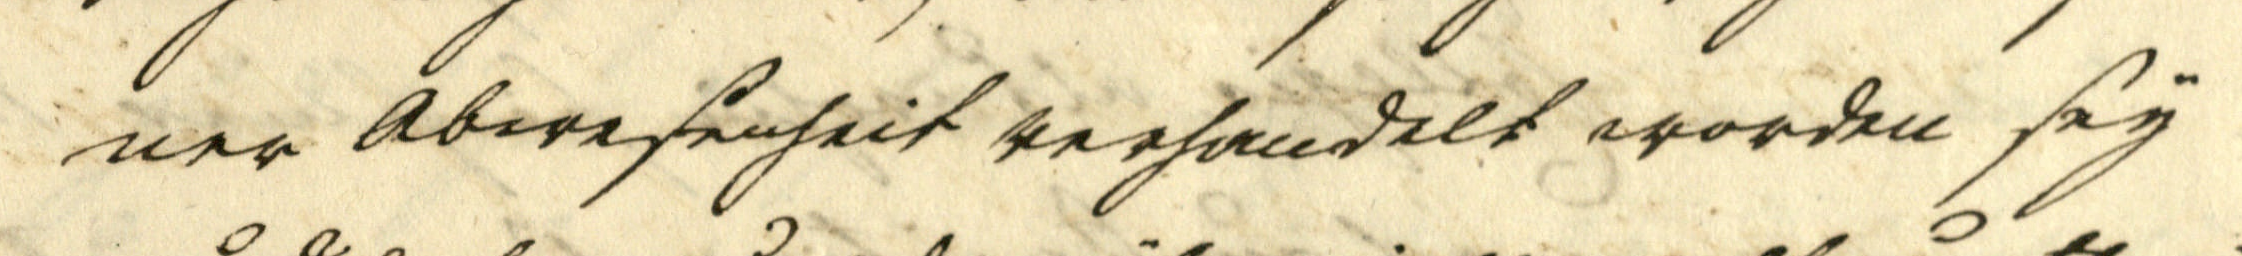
ner Abwesenheit verhandelt worden seÿ
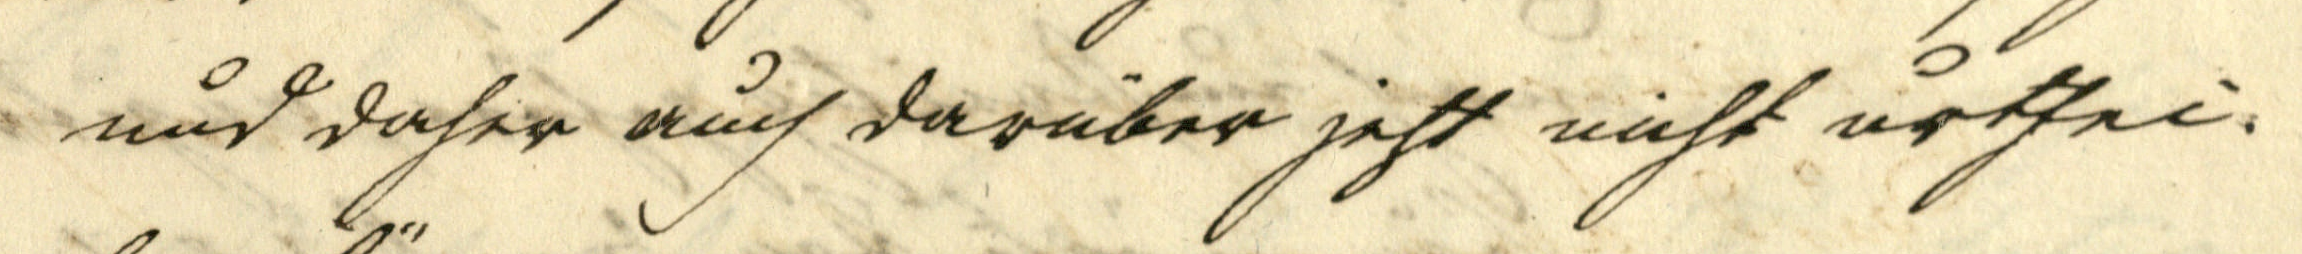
und daher auch darüber jetzt nicht urthei¬
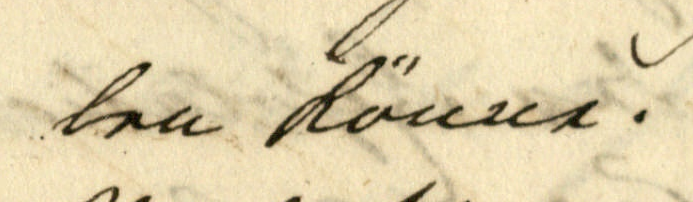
len könne.
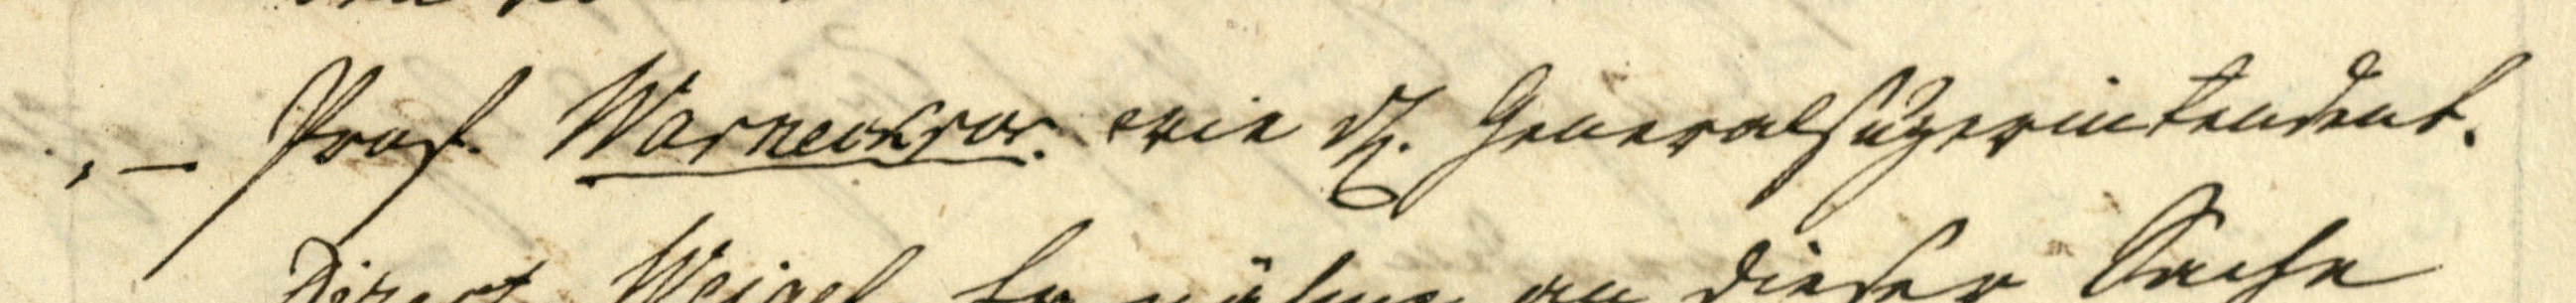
Prof. Warneckros. wie dh. Generalsuperintendent.
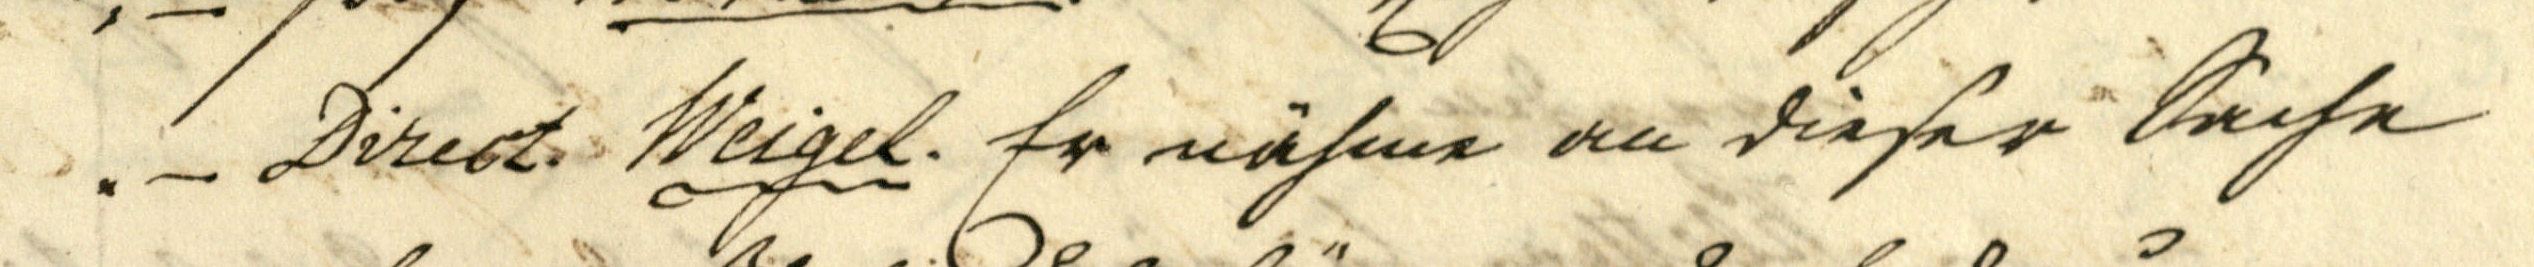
Direct. Weigel. Er nähme an dieser Sache
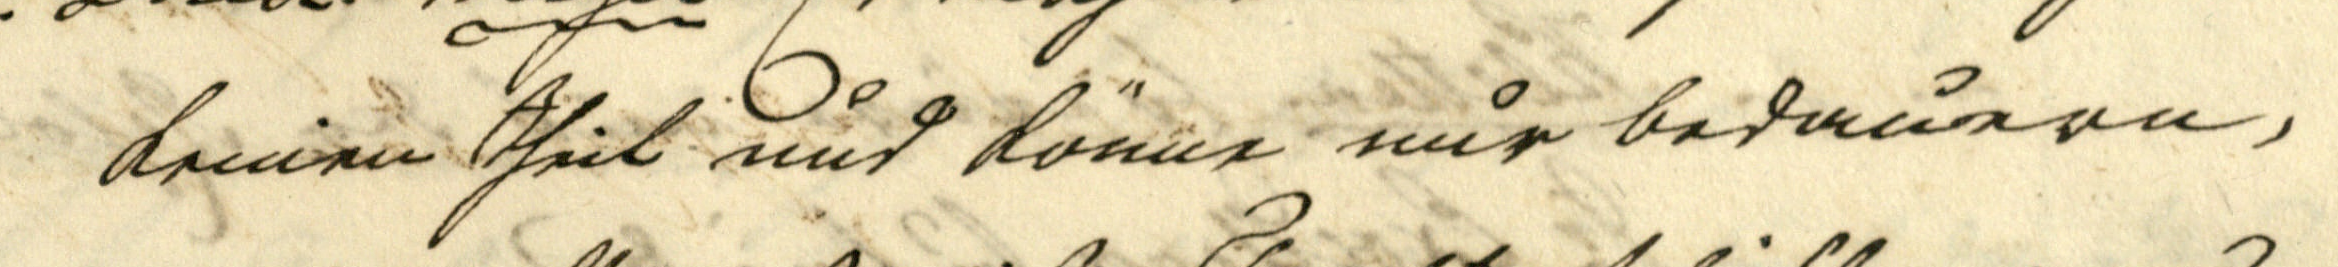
keinen Theil und könne nur bedauern,
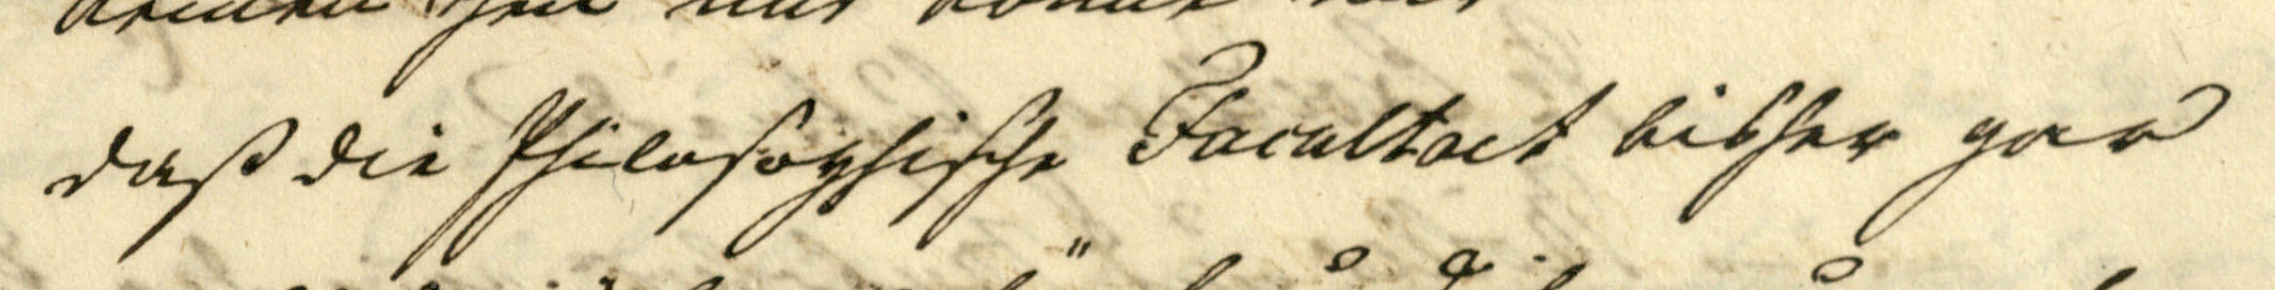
daß die Philosophische Facultaet bisher gar
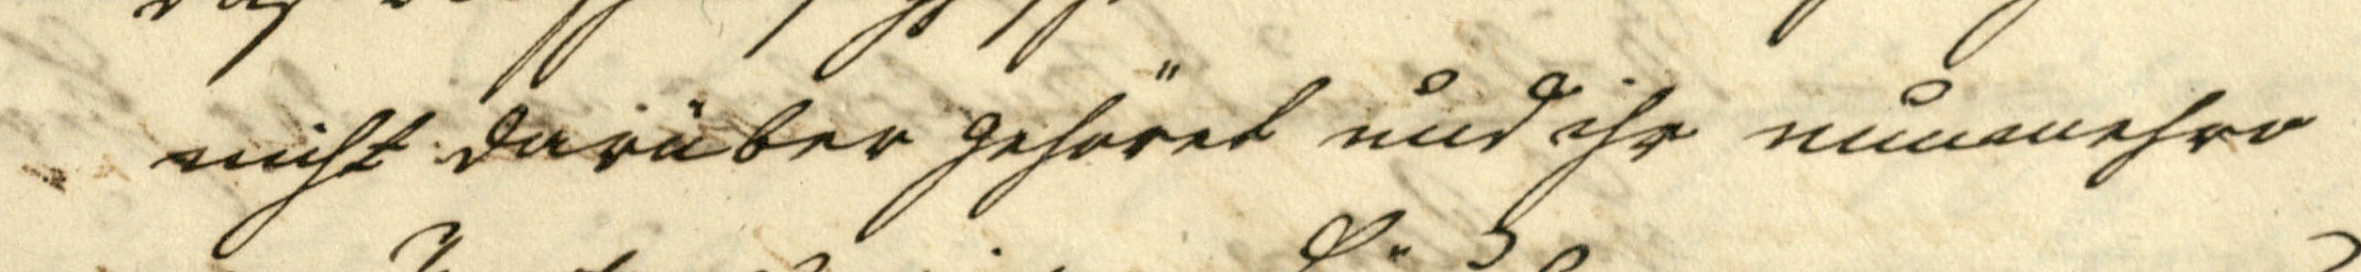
nicht darüber gehöret und ihr nunmehro
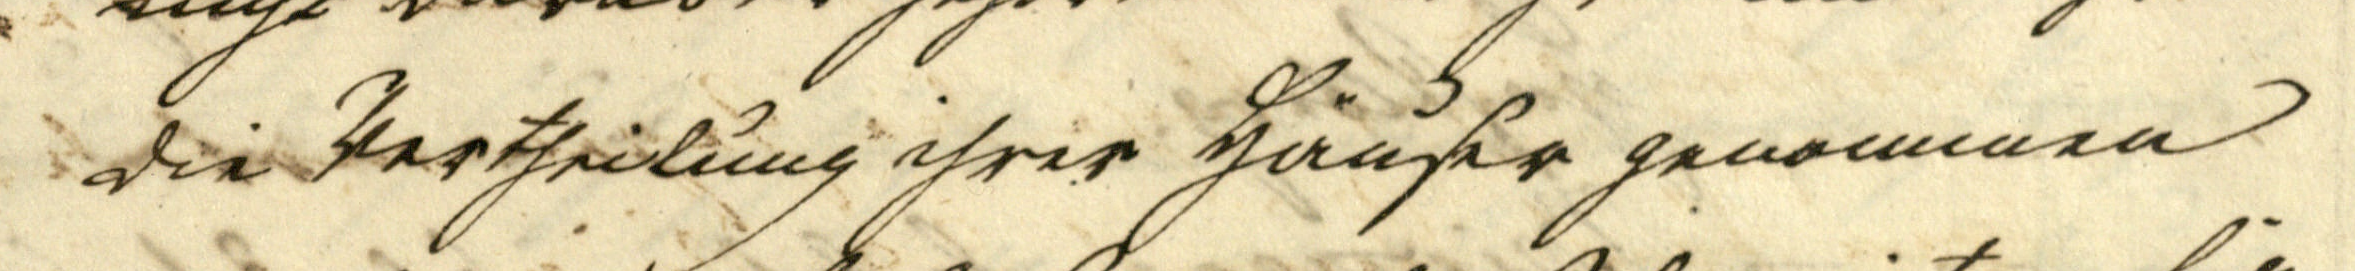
die Vertheilung ihrer Häuser genommen
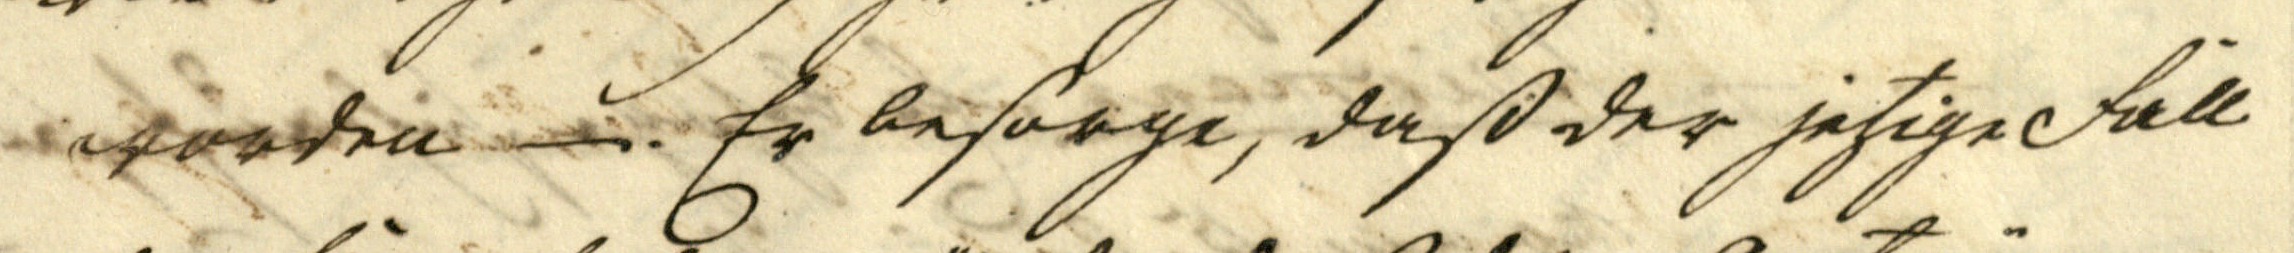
worden. Er besorge, daß der jetzige Fall
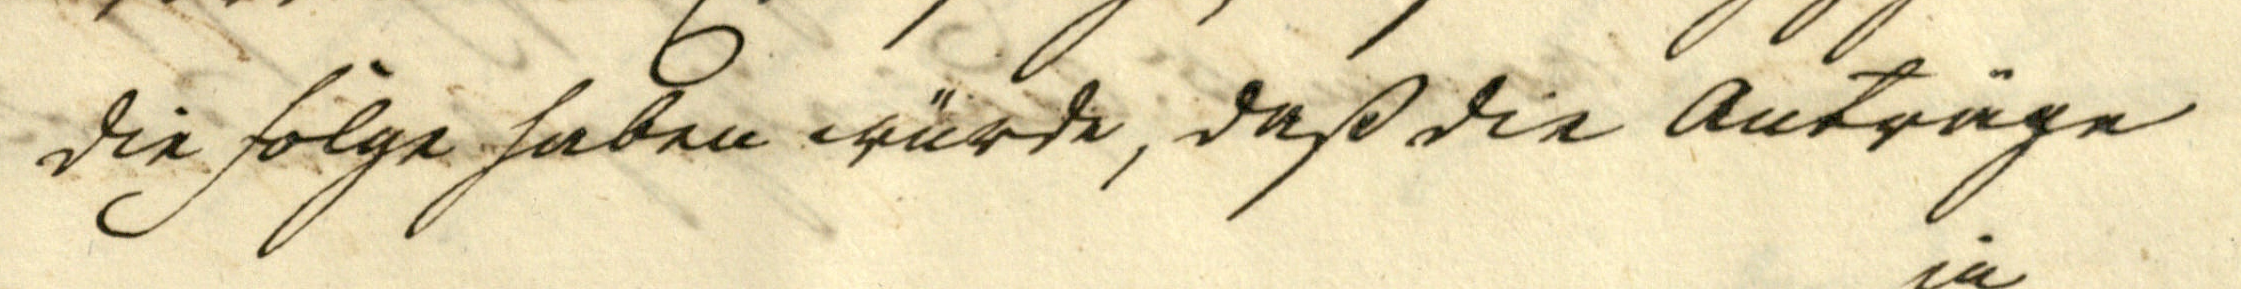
die Folge haben würde, daß die Anträge
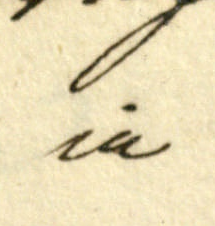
in
